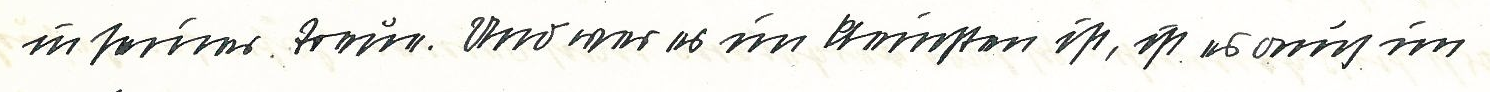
in seiner Treue. Und wer es im Kleinsten ist, ist es auch im
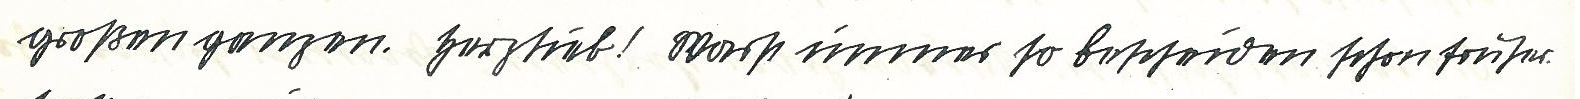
großen ganzen. Herzlieb! Warst immer so bescheiden schon früher.
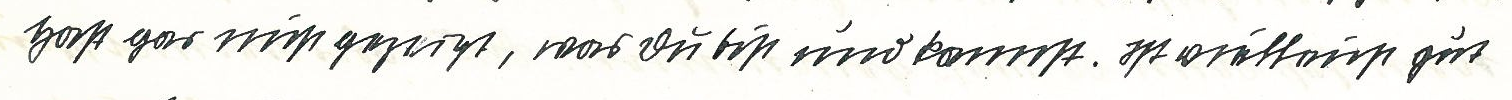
Hast nicht gezeigt, was Du bist und kannst. Ist vielleicht gut
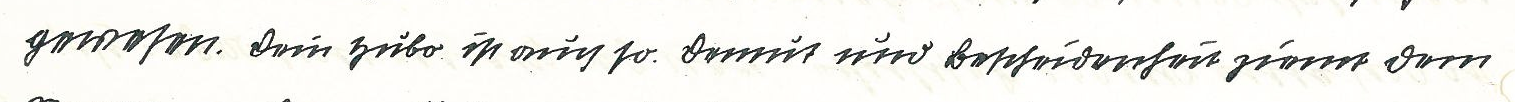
gewesen. Dein Hubo ist auch so. Demut und Bescheidenheit ziemt dem
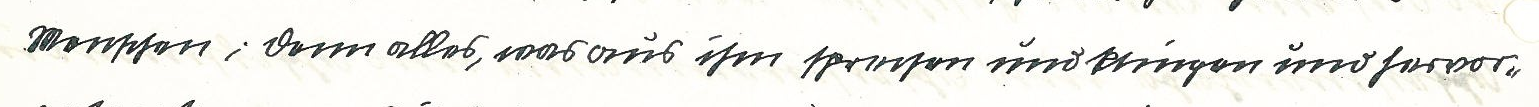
Menschen; denn alles, was aus ihm sprechen und klingen und hervor¬
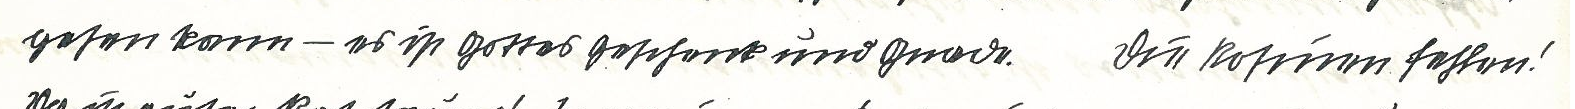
gehen kann – es ist Gottes Geschenk und Gnade. Die Rosinen fehlen!
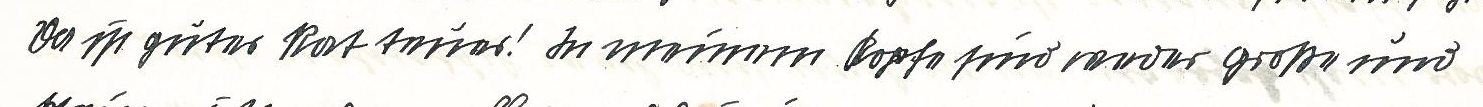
Da ist guter Rat teuer! In meinem Kopfe sind weder große und
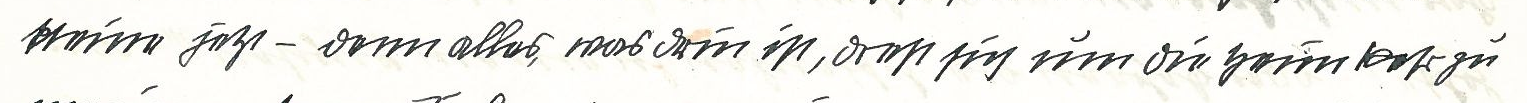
kleine jetzt – denn alles, was drin ist, dreht sich um die Heimkehr zu
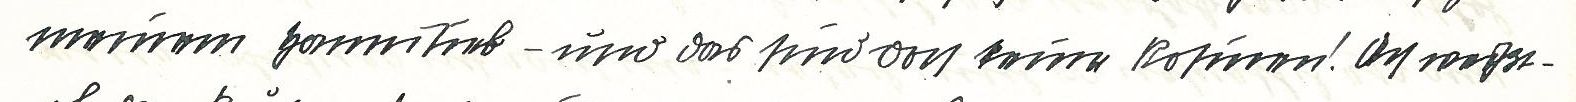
meinem lieb – und das sind doch keine Rosinen! Ach weißt –
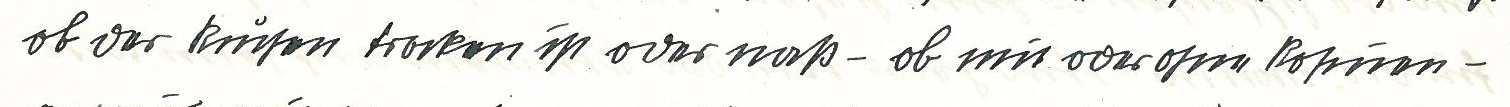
ob der Kuchen trocken ist oder naß – ob mit oder ohne Rosinen –
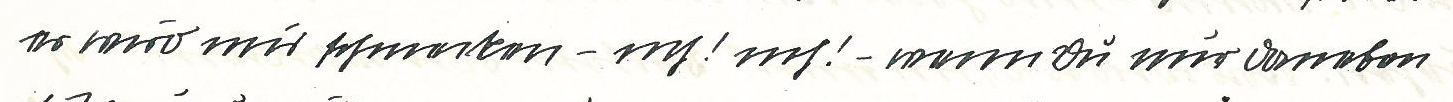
er wird mir schmecken – Hm! Hm! – wenn Du nur daneben
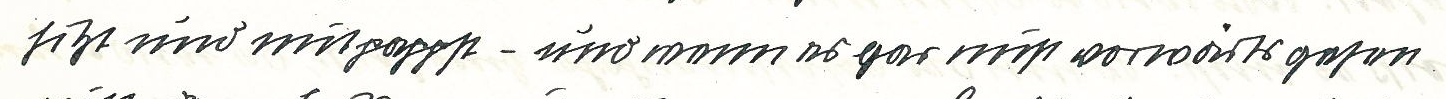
sitzt und mitpappst – und wenn es gar nicht vorwärts gehen
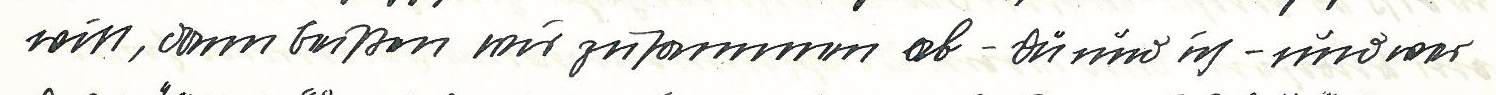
will, dann beißen wir zusammen ab – Du und ich – und wer
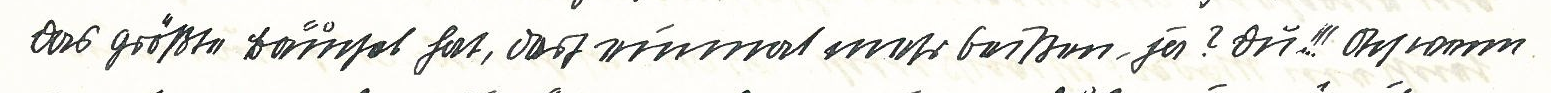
das größte Bäuchel hat, darf einmal mehr beißen, ja? Du!!! Ach wenn
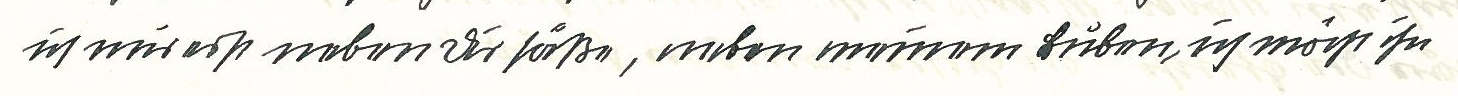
ich nur erst neben Dir säße, neben meinem Buben, ich möcht ihn
